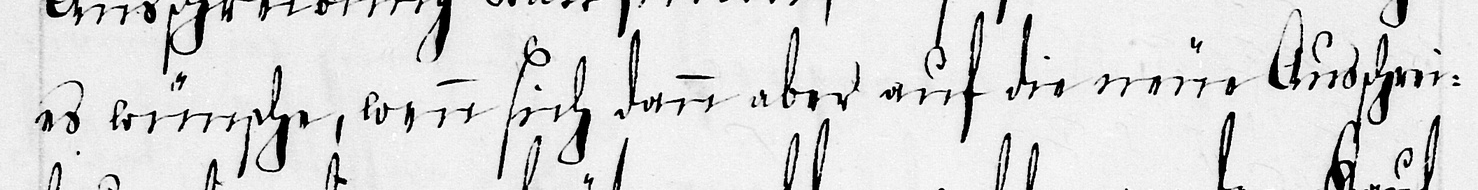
es wünsche, wenn sich dann aber auf die neue Ausschrei¬
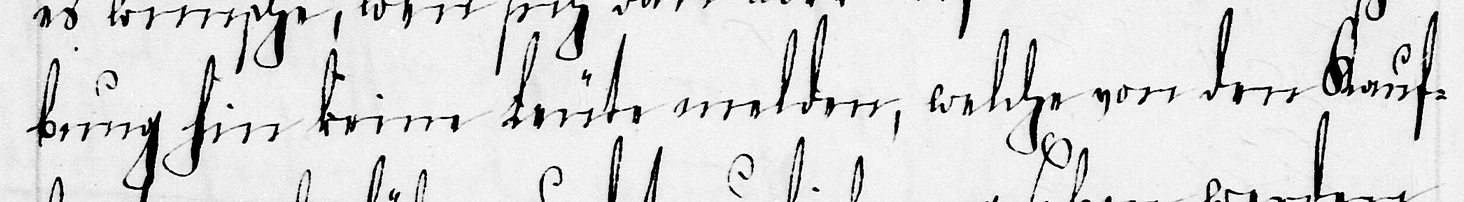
bung hin keine Leute melden, welche von den Kauf¬
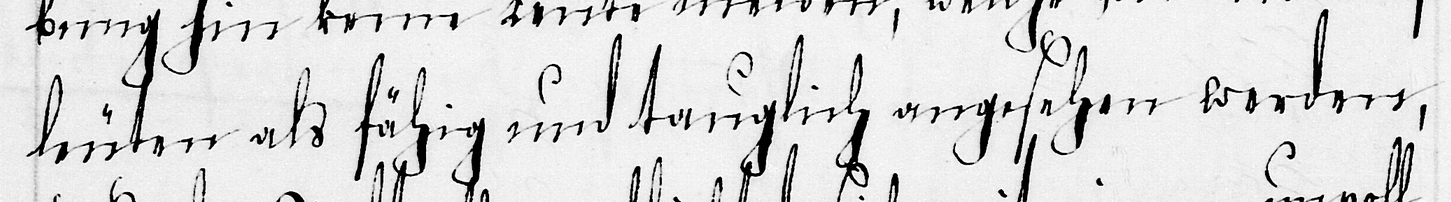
leuten als fähig und tauglich angesehen werden,
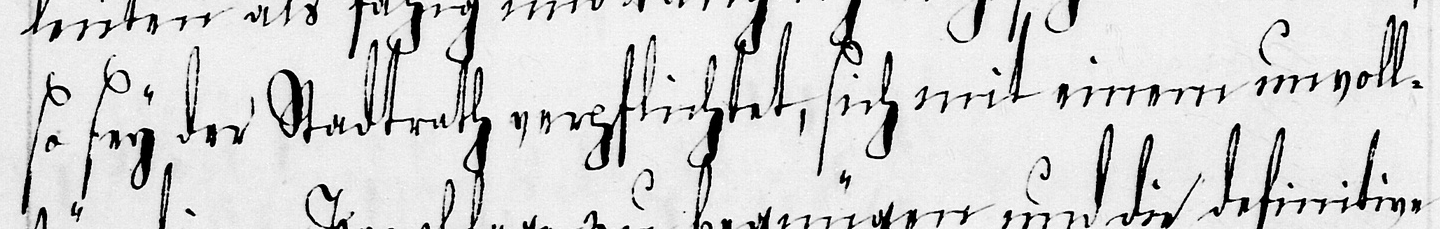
so sey der Stadtrath verpflichtet, sich mit einem unvoll¬
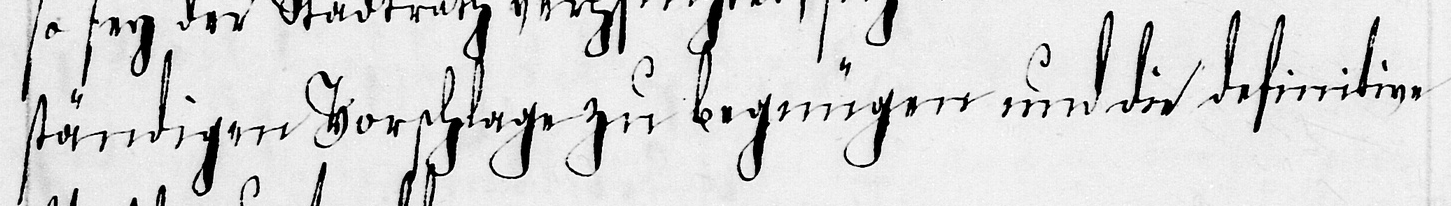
ständigen Vorschlage zu begnügen und die definitive
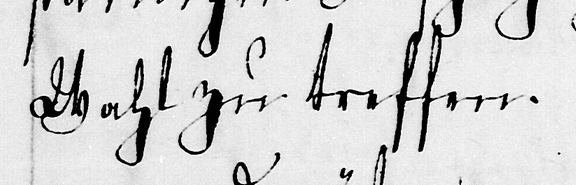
Wahl zu treffen.
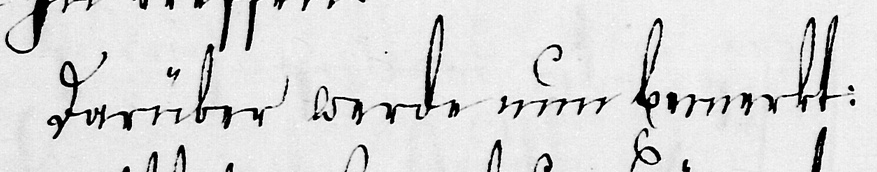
Darüber werde nun bemerkt:
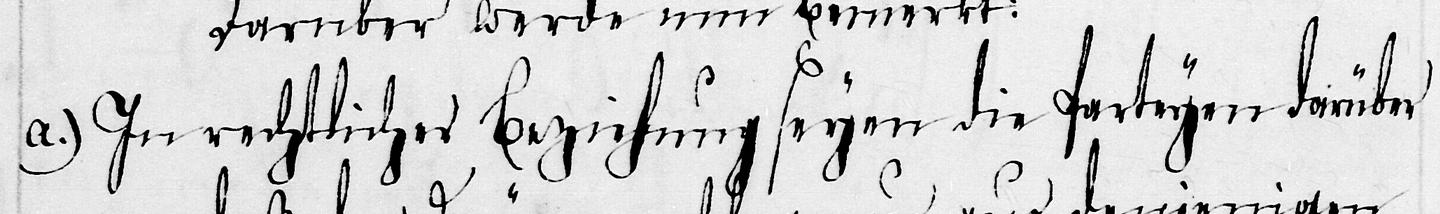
a.) In rechtlicher Beziehung seyen die Parteyen darüber
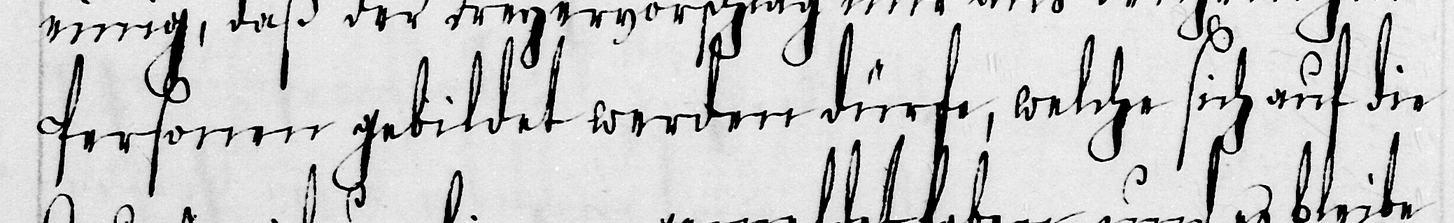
Personen gebildet werden dürfe, welche sich auf die
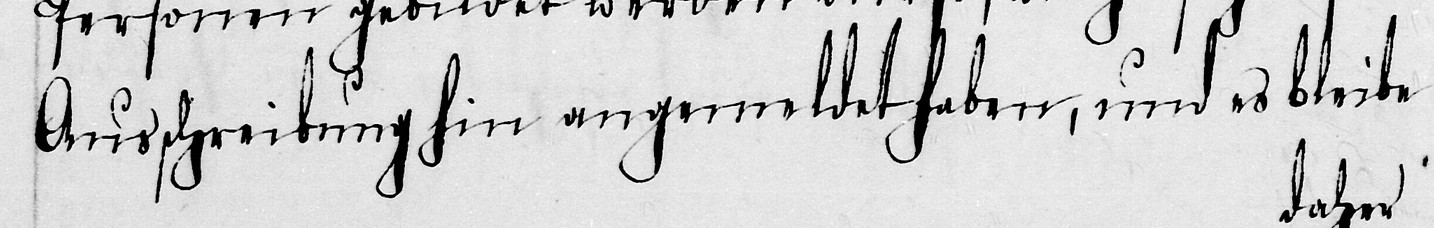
Ausschreibung hin angemeldet haben, und es bleibe
